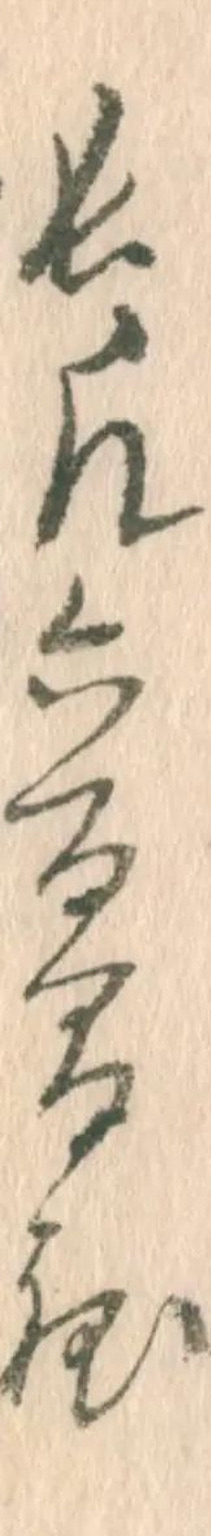長凡六百間程
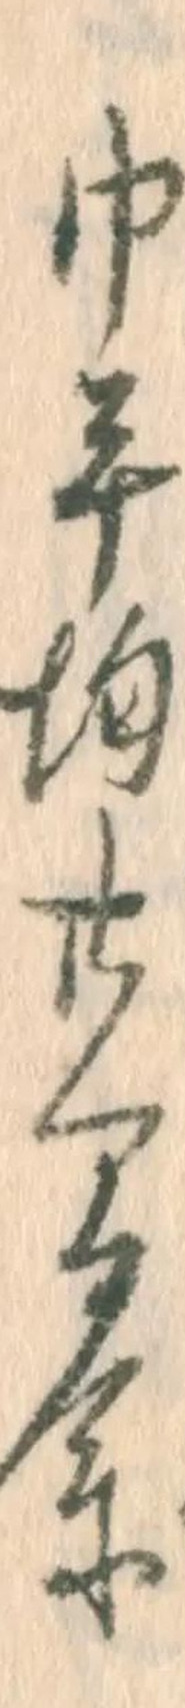幅平均廿間余
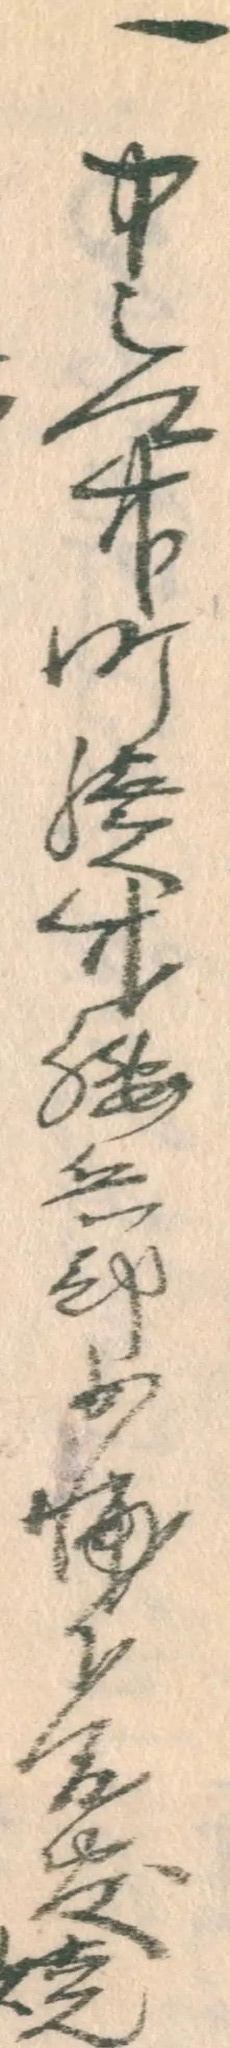一中之郷竹町続竹腰兵部少輔下屋敷焼
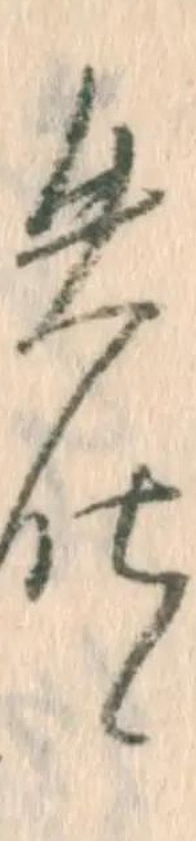失仕候
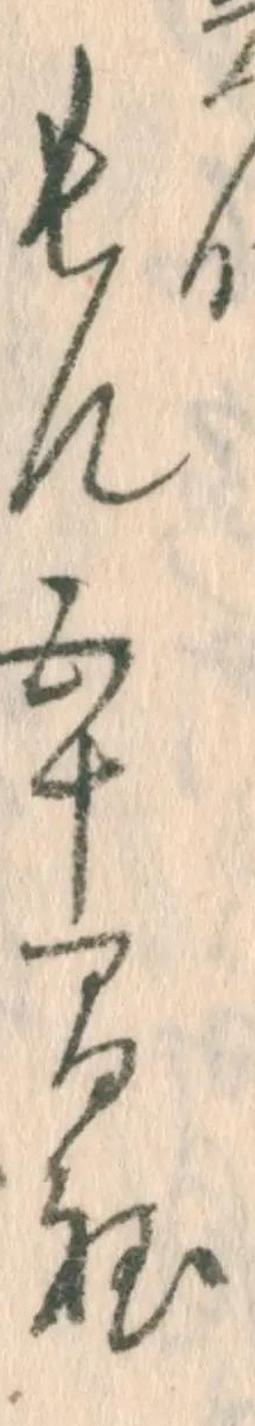長凡五十間程
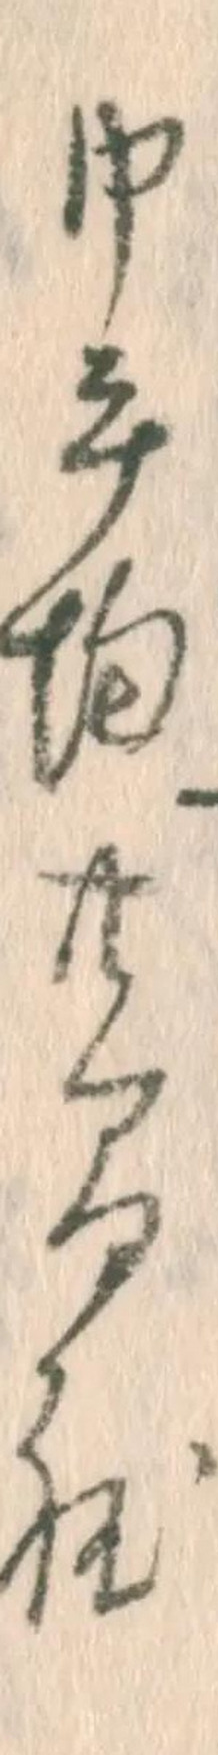幅平均廿間程
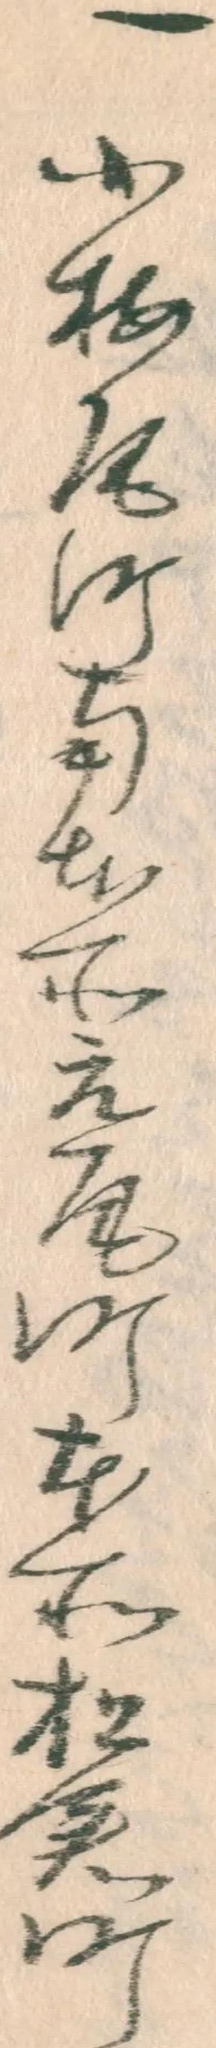一小梅瓦町南本所元瓦町本所松倉町
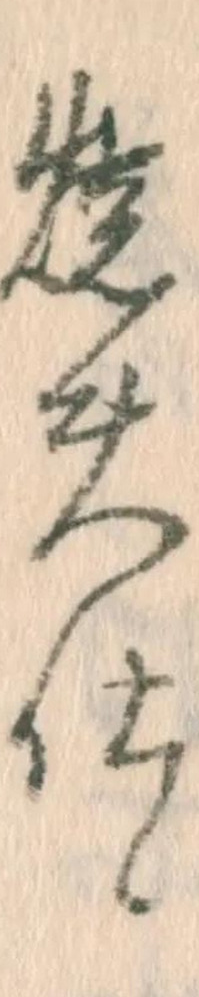焼失仕候
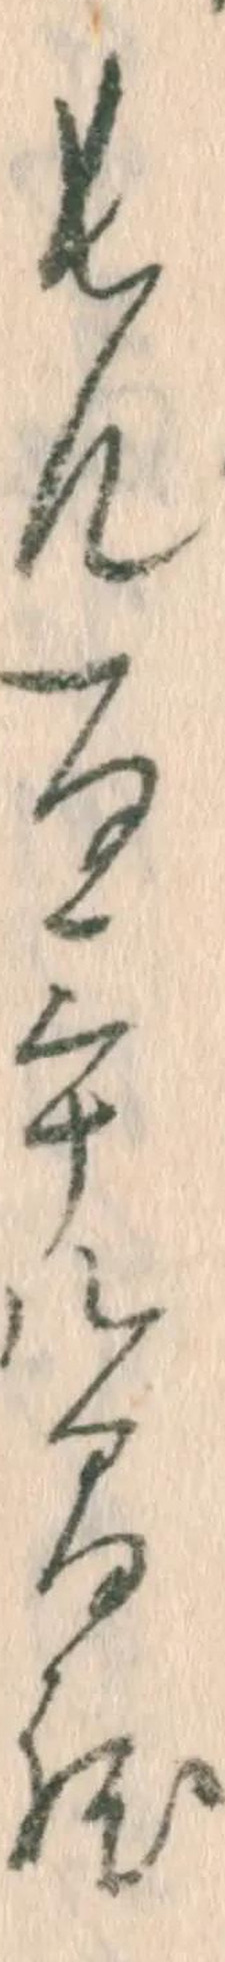長凡百三十八間程
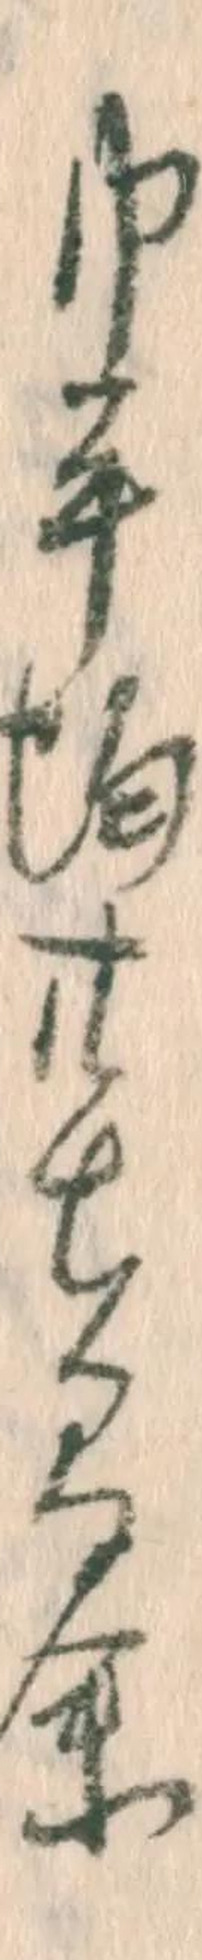幅平均廿七間余
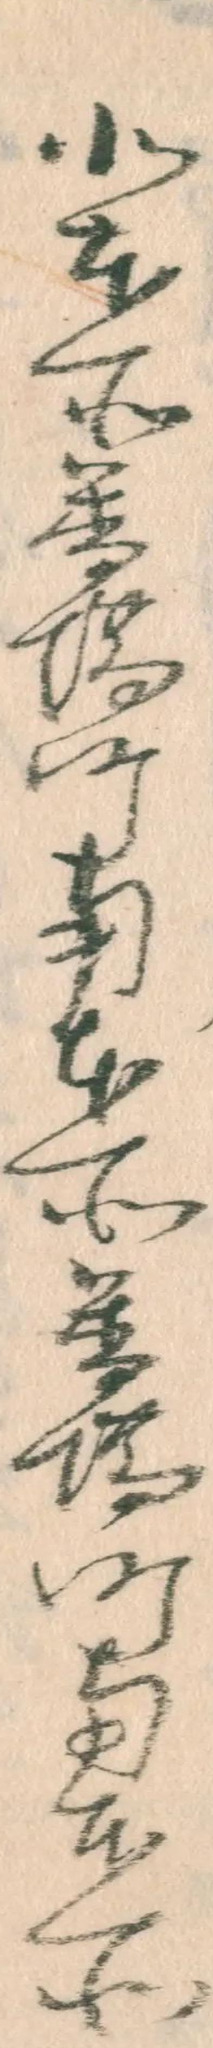一北本所番場町南本所番場町南本所
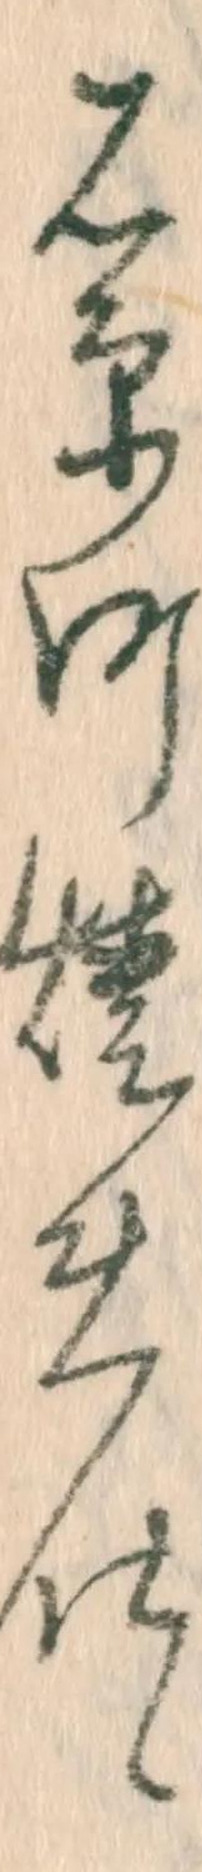石原町焼失仕候
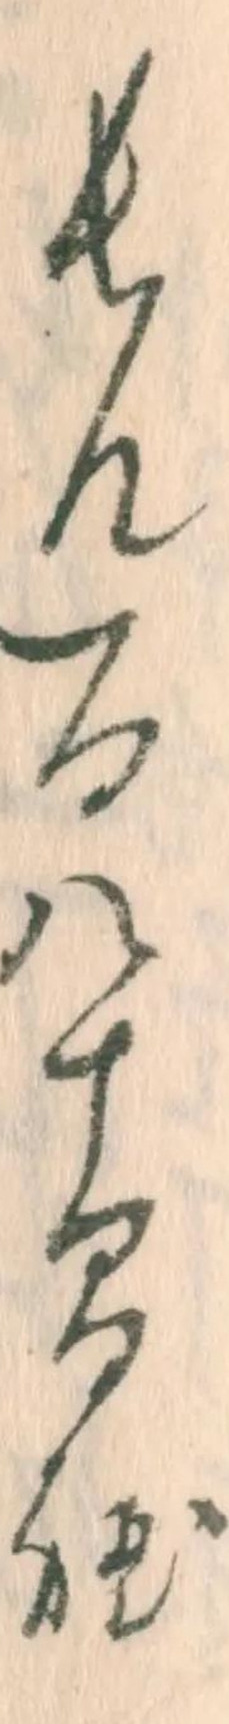長凡百八十間程
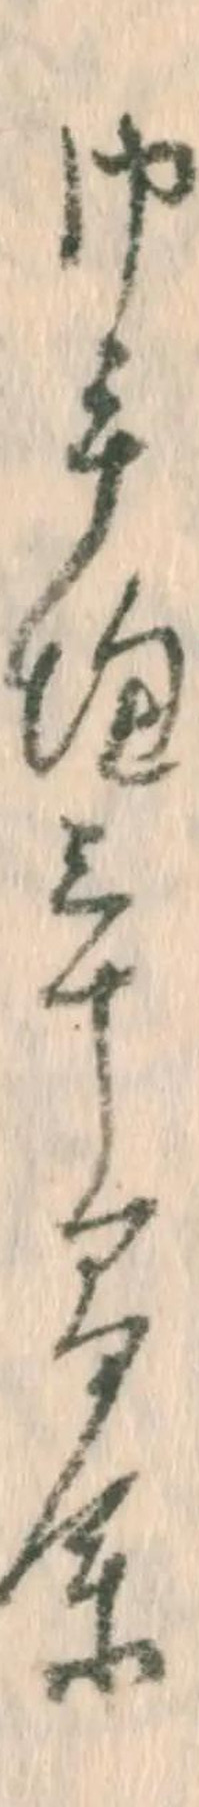幅平均三十間余
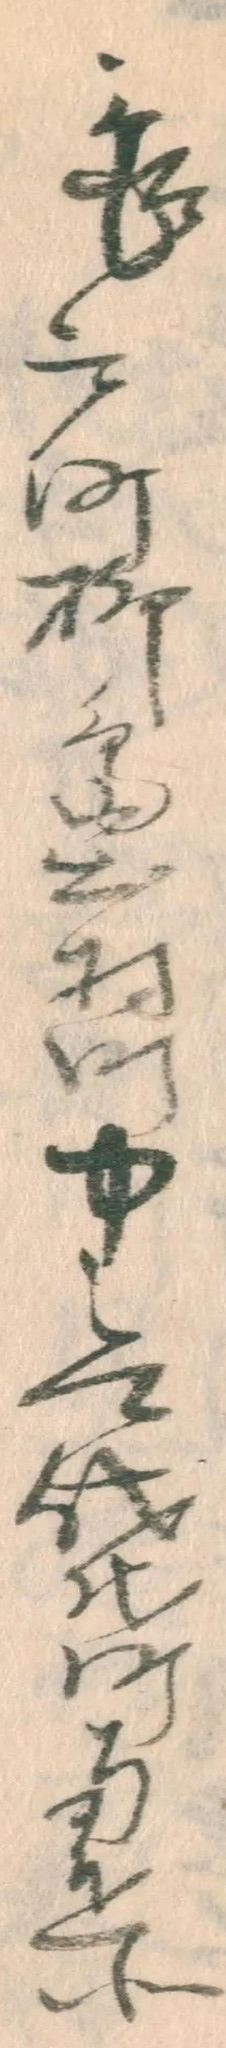一亀戸町柳島出村町中之郷代地町南本所
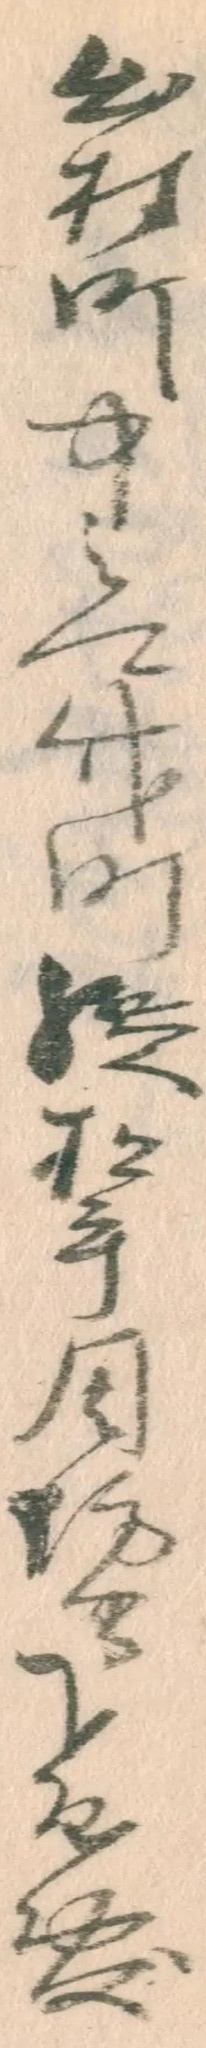出村町中之郷竹町続松平周防守下屋敷
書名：地震災書留 2巻. [1] 内表紙に「地震災書留　安政二卯年　但本所深川御用屋敷地代免除調」とあり
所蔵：国立国会図書館 National Diet Library, JAPAN
